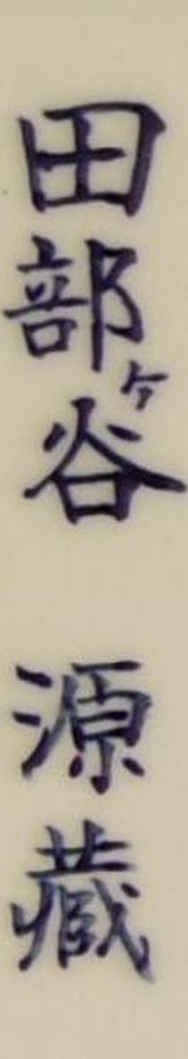田部ヶ谷源蔵
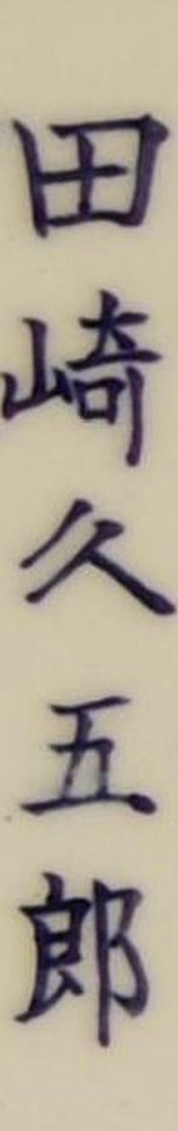田崎久五郎
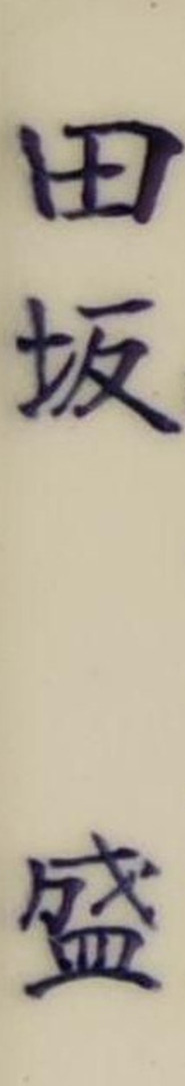田坂盛

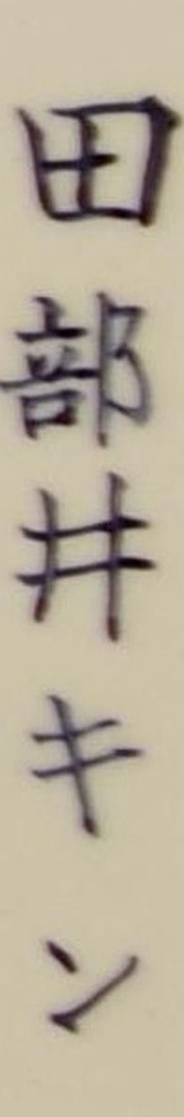田部井キン
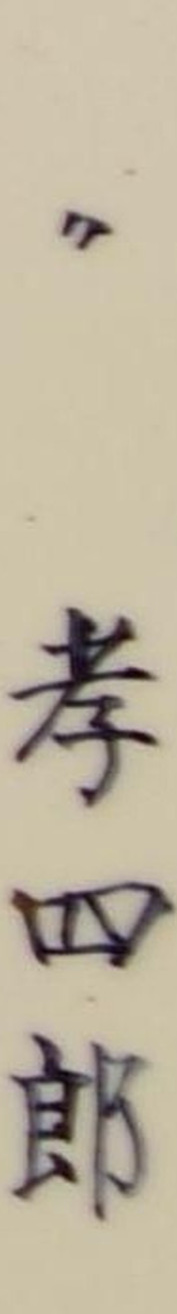孝四郎
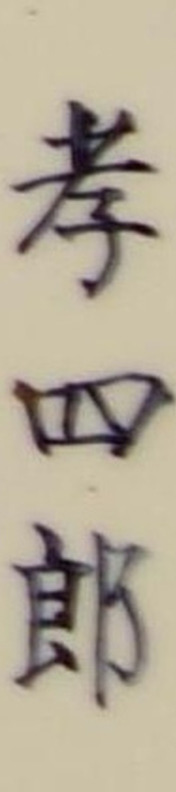孝四郎
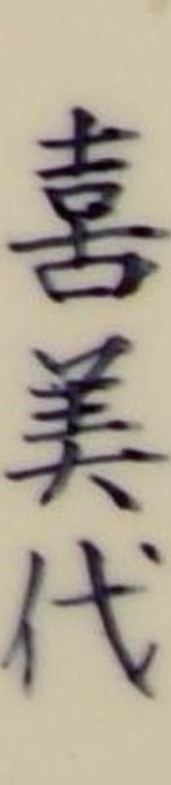喜美代
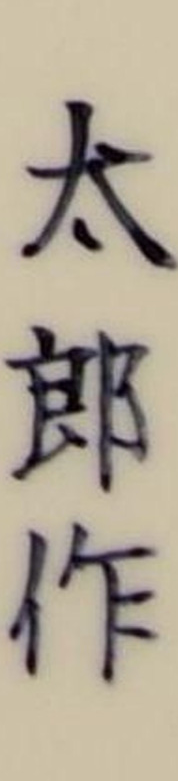太郎作
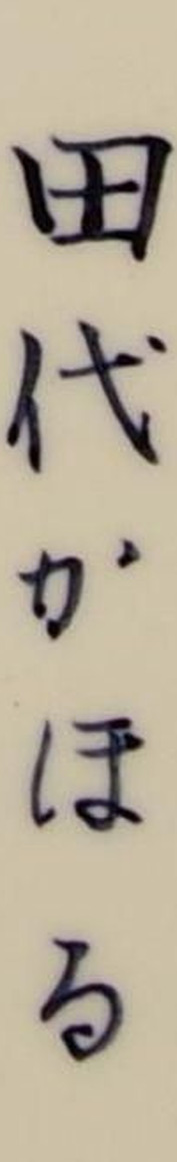田代かほる
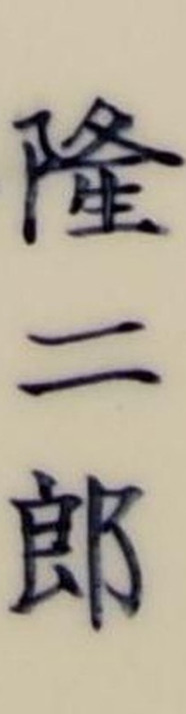隆二郎
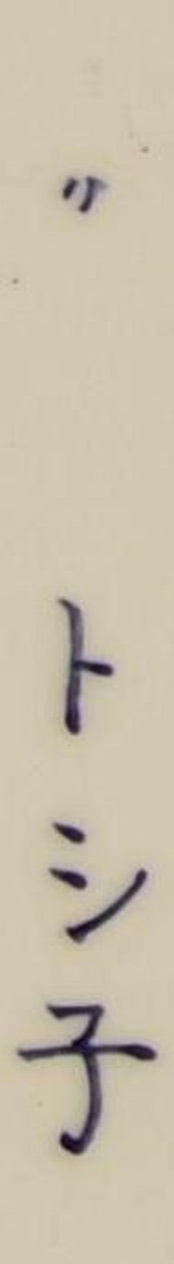トシ子
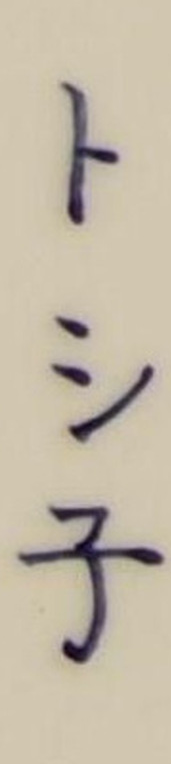トシ子
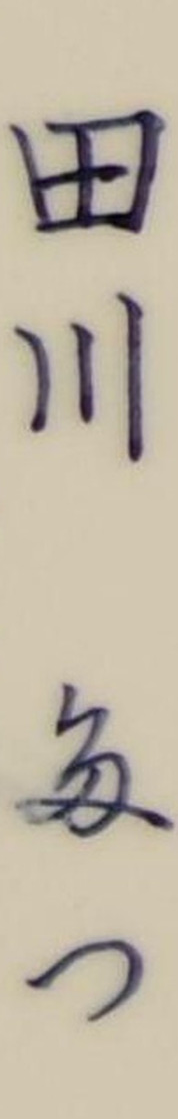田川たつ
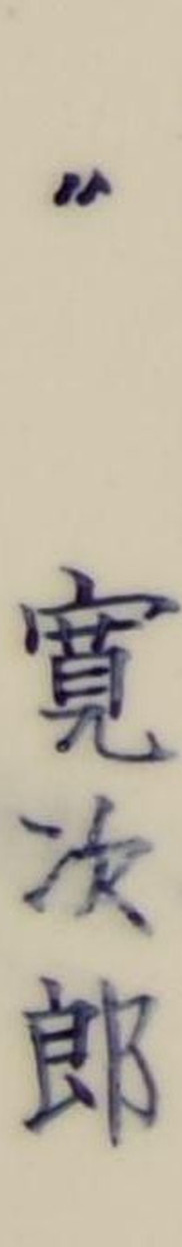寛次郎
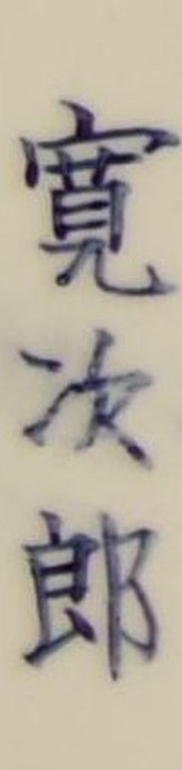寛次郎

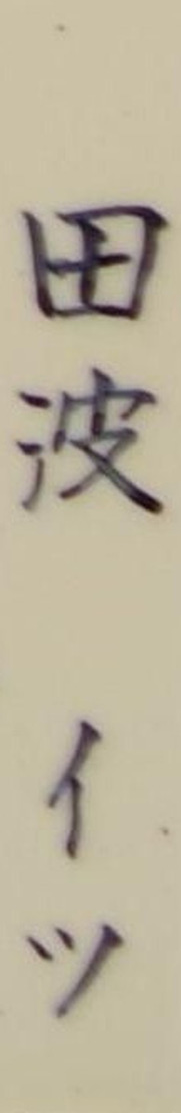田波イツ
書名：A~D
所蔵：koyasan kongobuji
